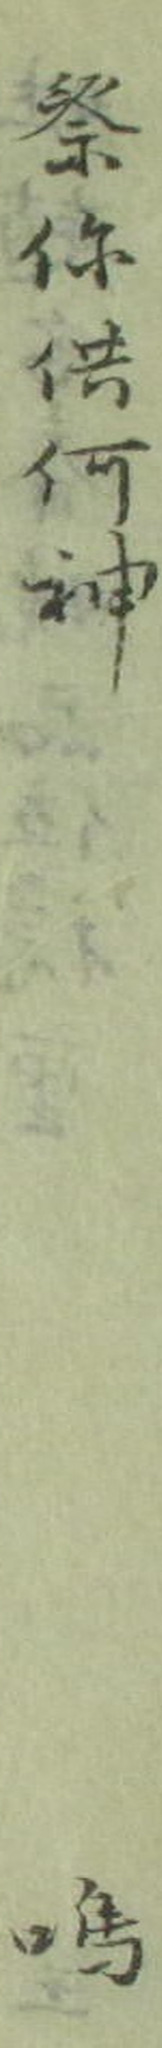祭你供何神鳴
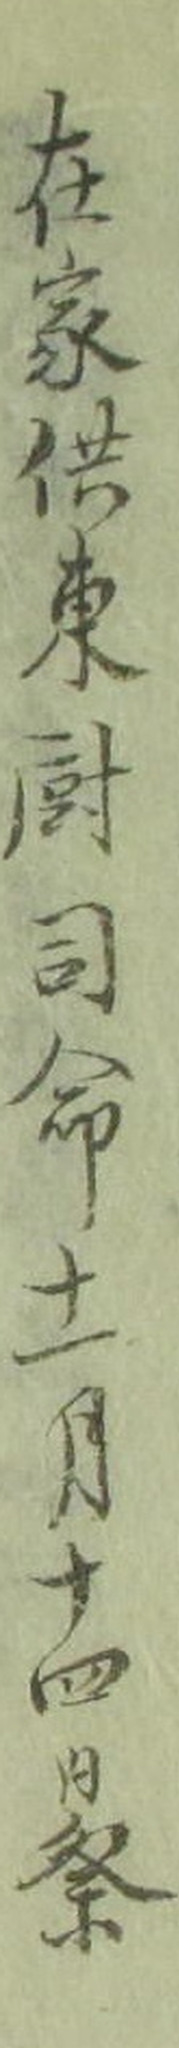在家供東厨司命十一月十四日祭王
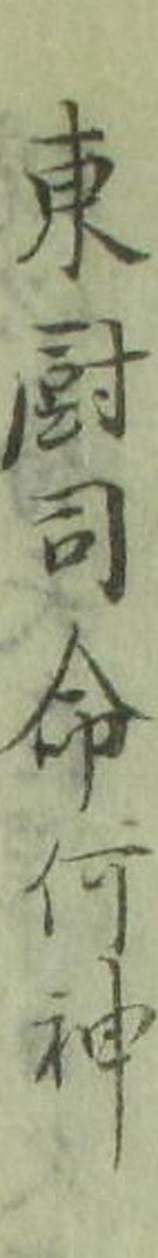東厨司命何神鳴
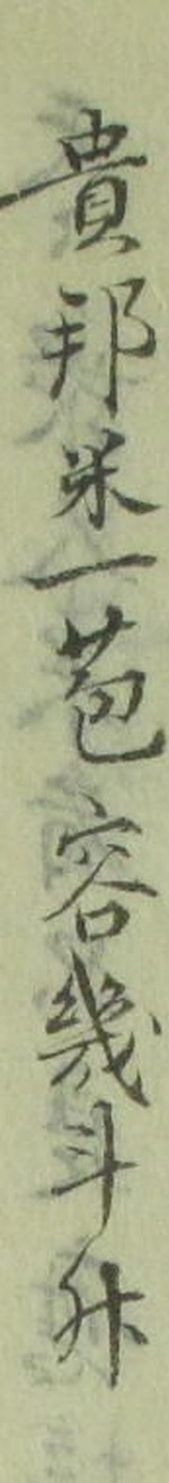貴邦米一苞容幾斗升鳴
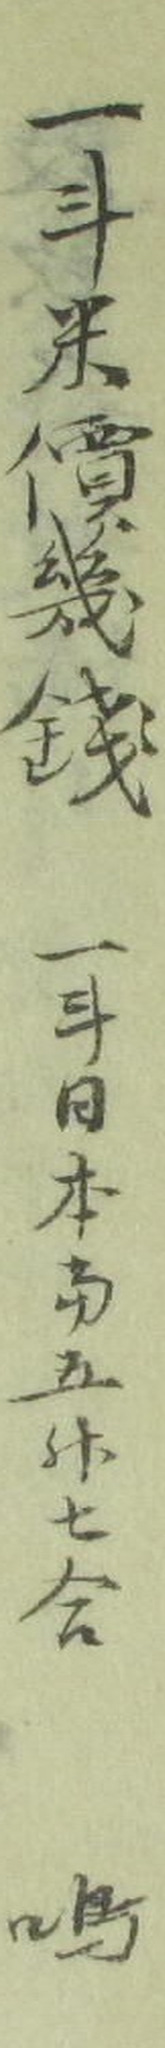一斗米価幾銭一斗日本当五升七合鳴
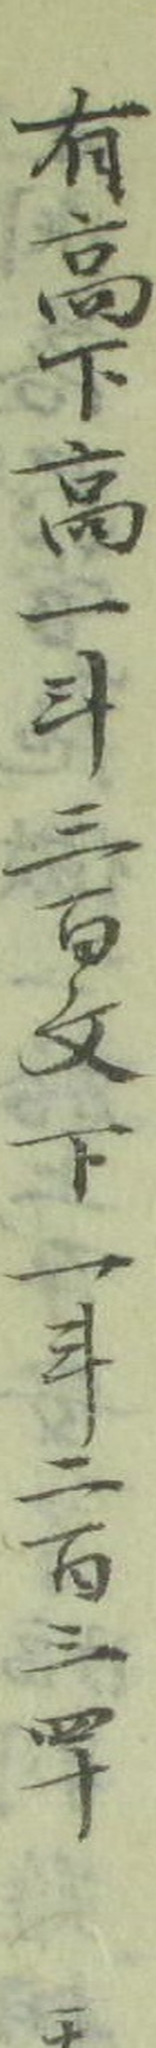有高下高一斗三百文下一斗二百三四十王
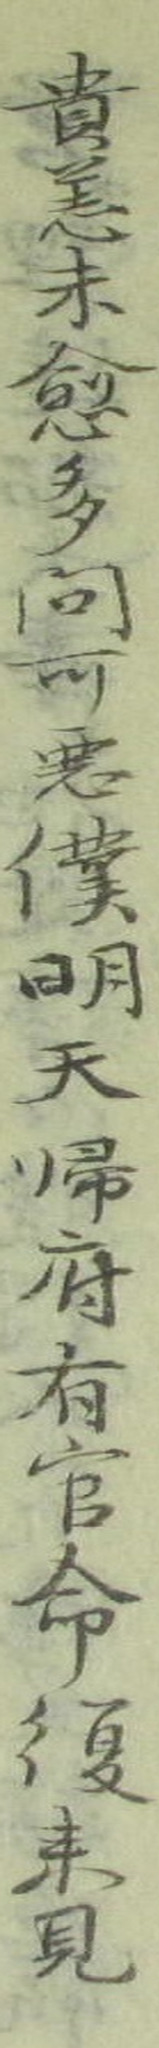貴恙未愈多問可悪僕明天帰府有官命復来見
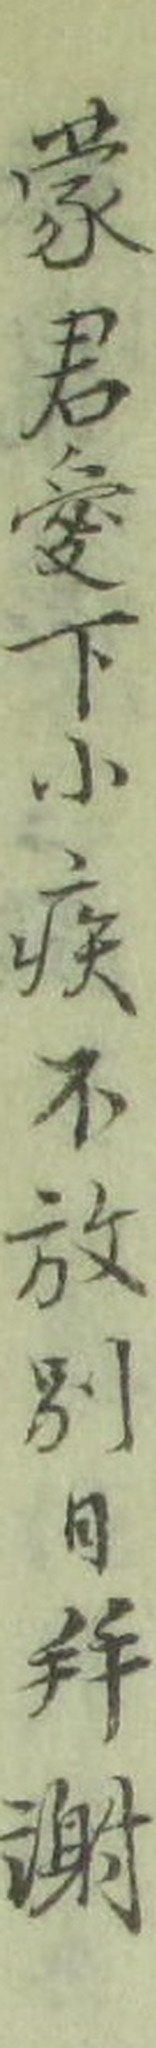蒙君愛下小疾不放別日拝謝王
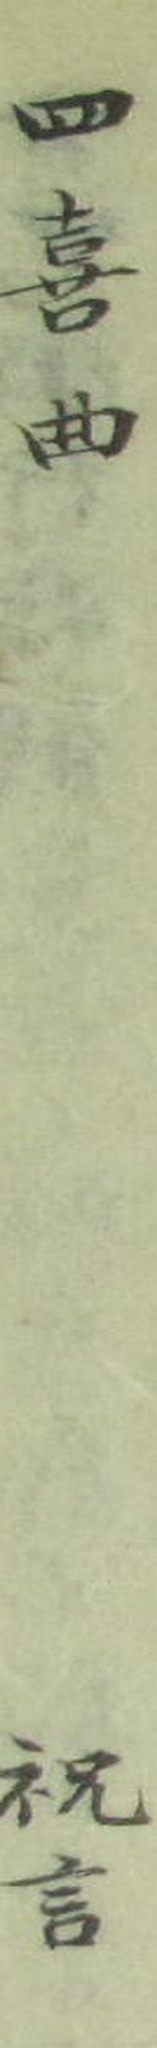四喜曲祝言
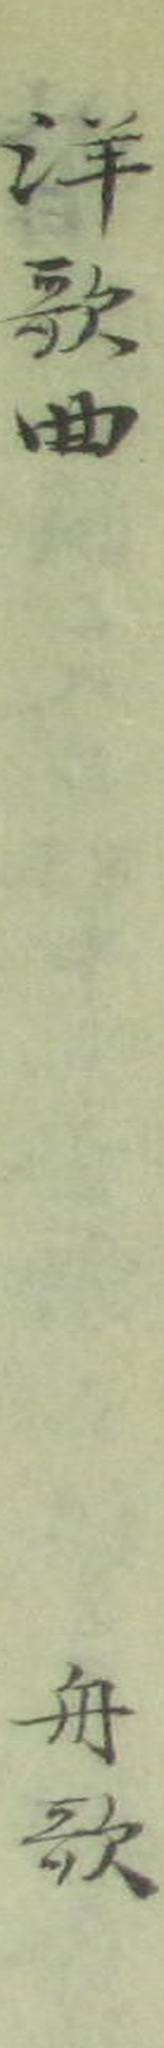洋歌曲舟歌
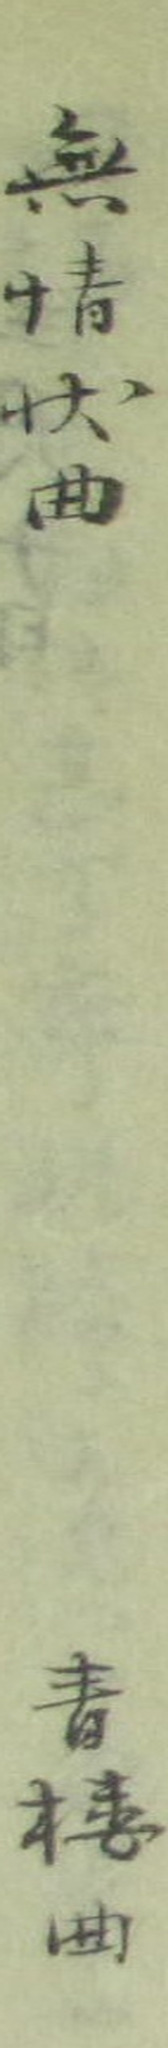無情状曲青楼曲

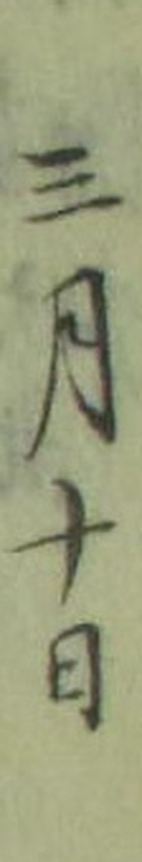三月十日
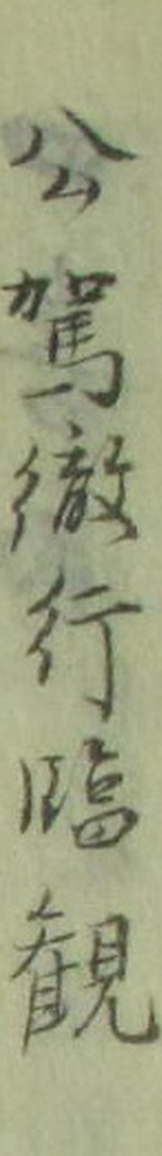公駕徹行臨観
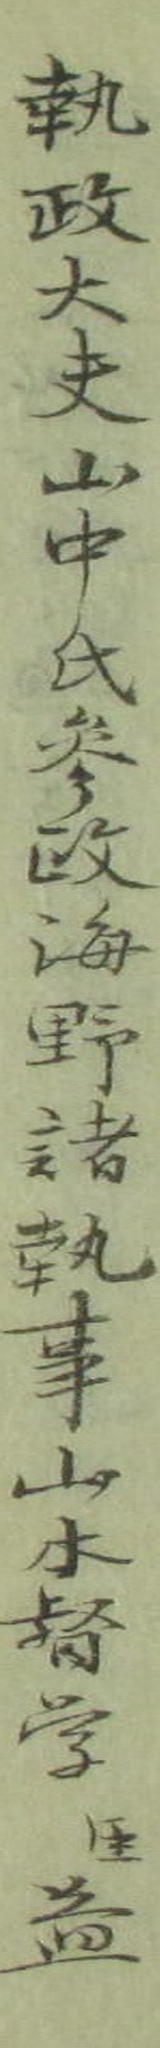執政大夫山中氏参政海野諸執事山本督学臣益
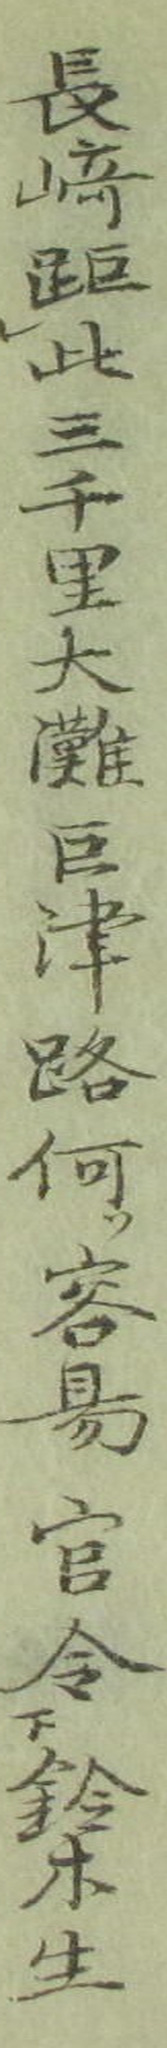長崎距此三千里大灘巨津路何容易官令鈴木生
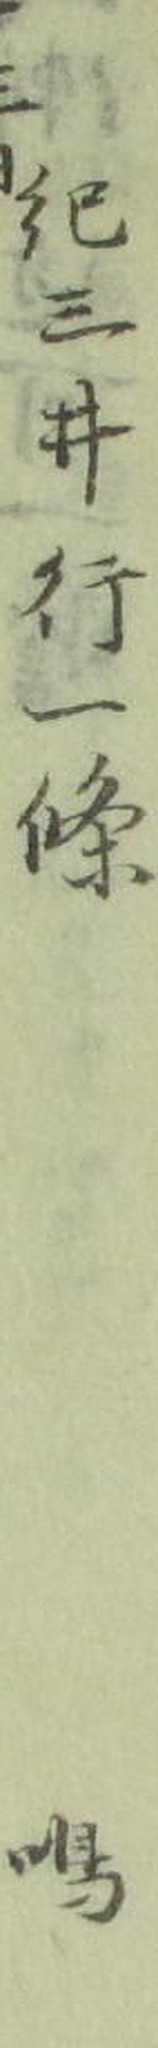紀三井行一条鳴
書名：紀州九木浦庄屋記録 四
